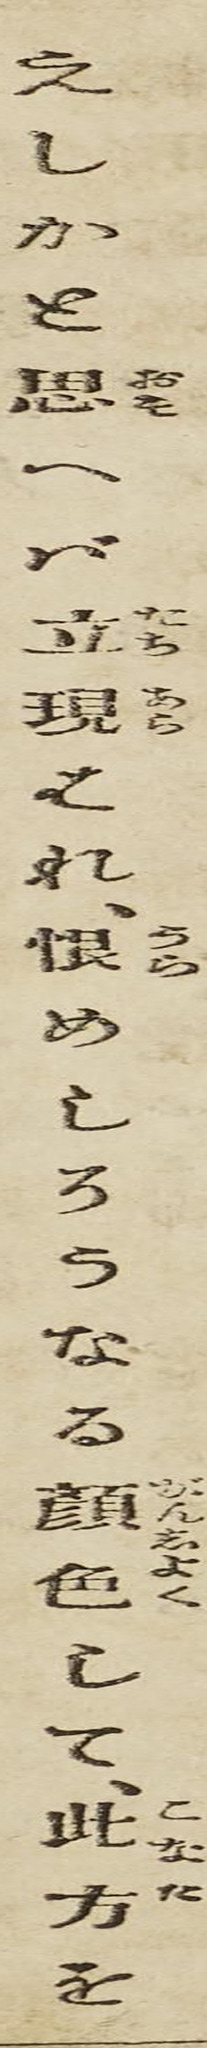えしかと思へば立現はれ、恨めしそうなる顔色して、此方を
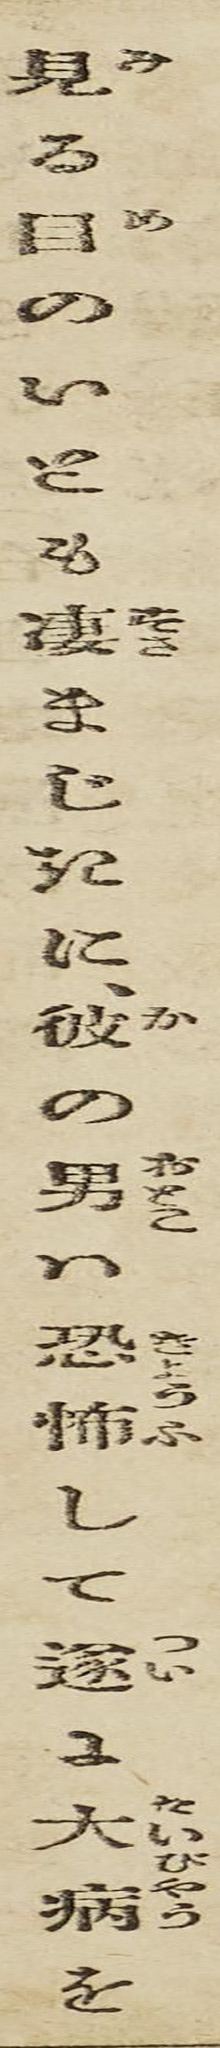見る目のいとも凄まじきに、彼の男は恐怖して遂に大病を

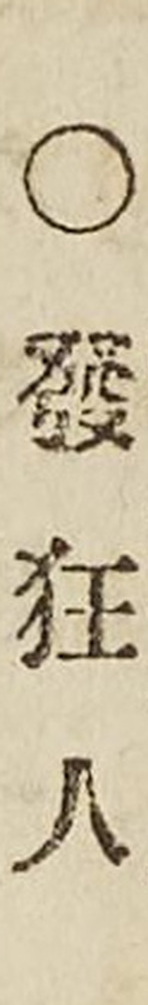○発狂人
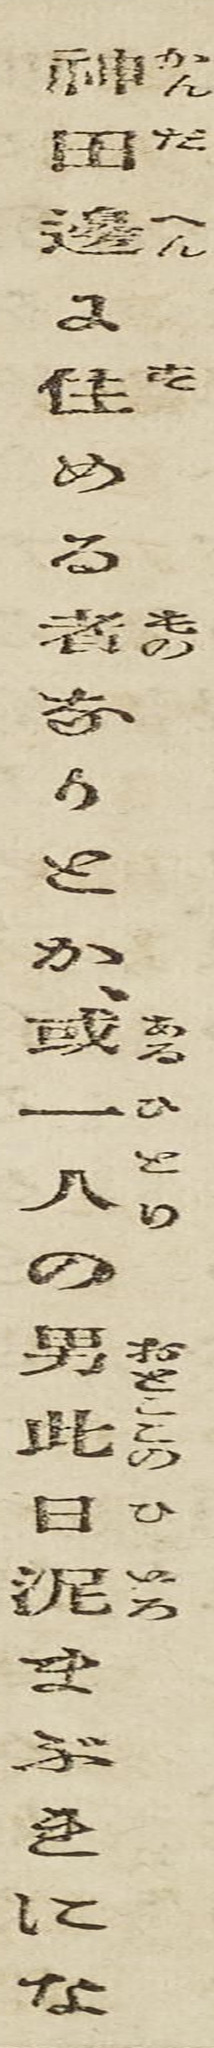神田辺に住める者なりとか、或一人の男此日泥まぶれにな
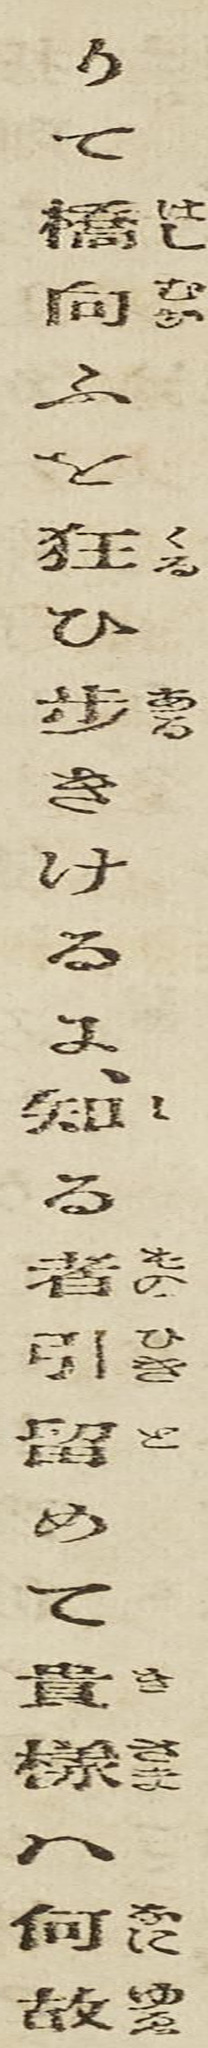りて橋向ふを狂ひ歩きけるに、知る者引留めて貴様は何故
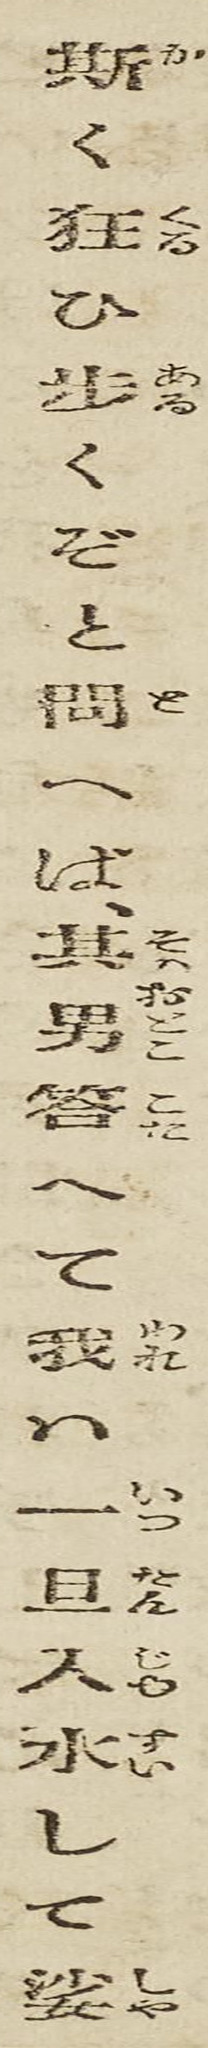斯く狂ひ歩くぞと問へば、其男答へて我は一旦入水して娑
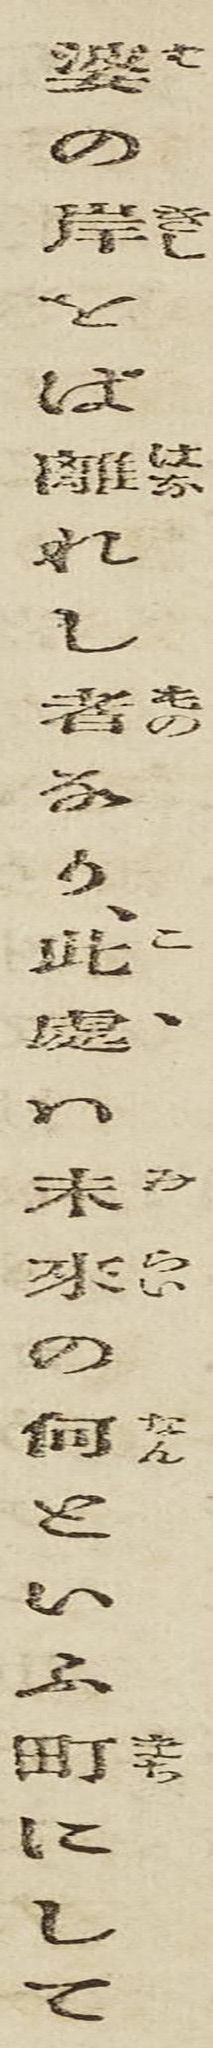婆の岸をば離れし者なり、此処は未来の何といふ町にして
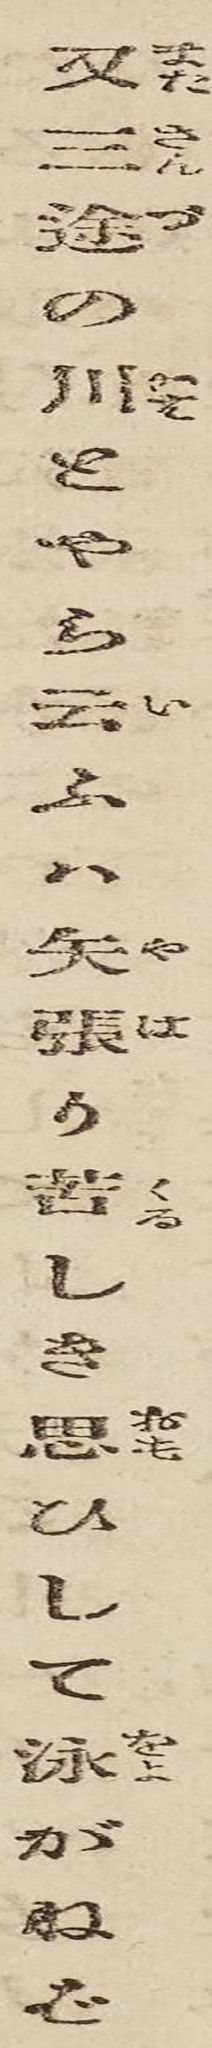又三途の川とやら云ふは矢張り苦しき思ひして泳がねば
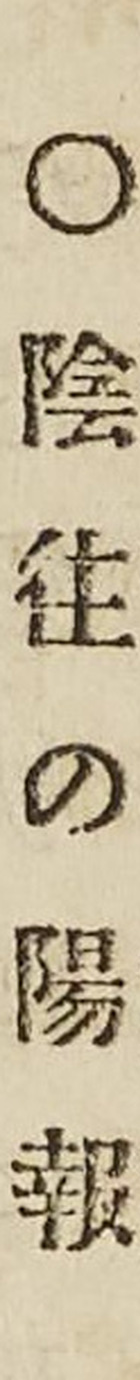○陰往の陽報
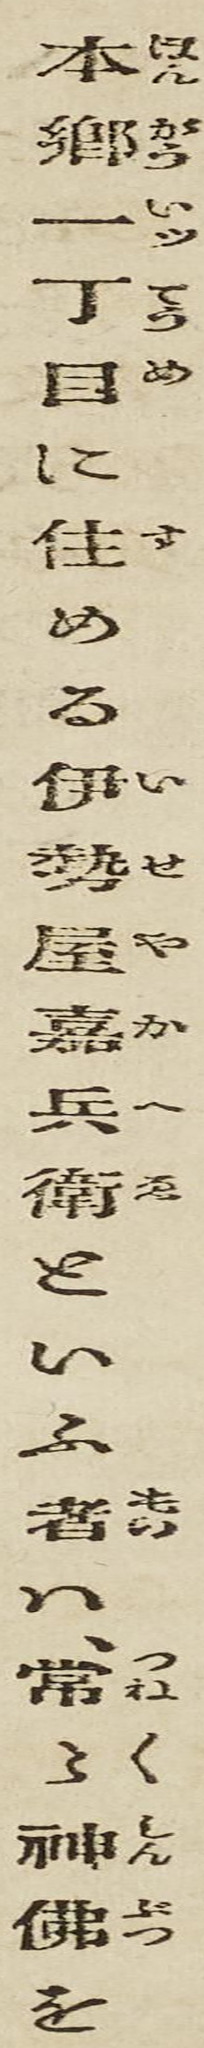本郷一丁目に住める伊勢屋嘉兵衛といふ者は、常〻神仏を
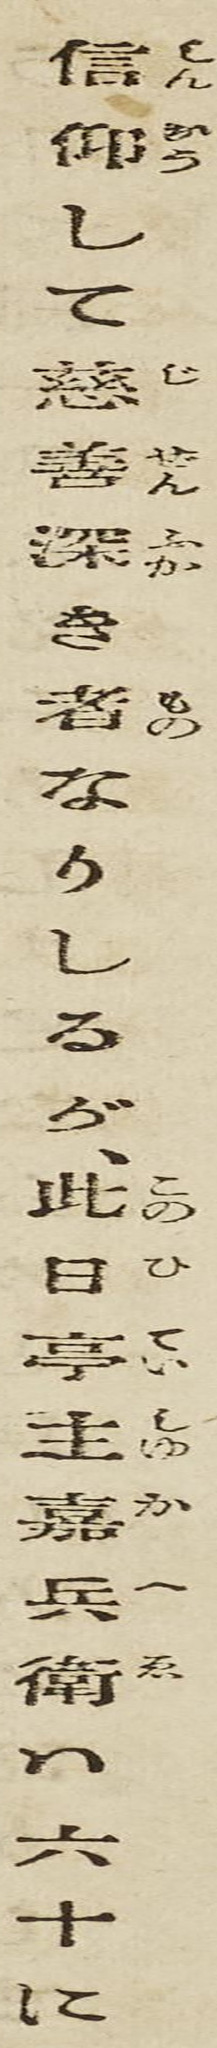信仰して慈善深き者なりしるが、此日亭主嘉兵衛は六十に
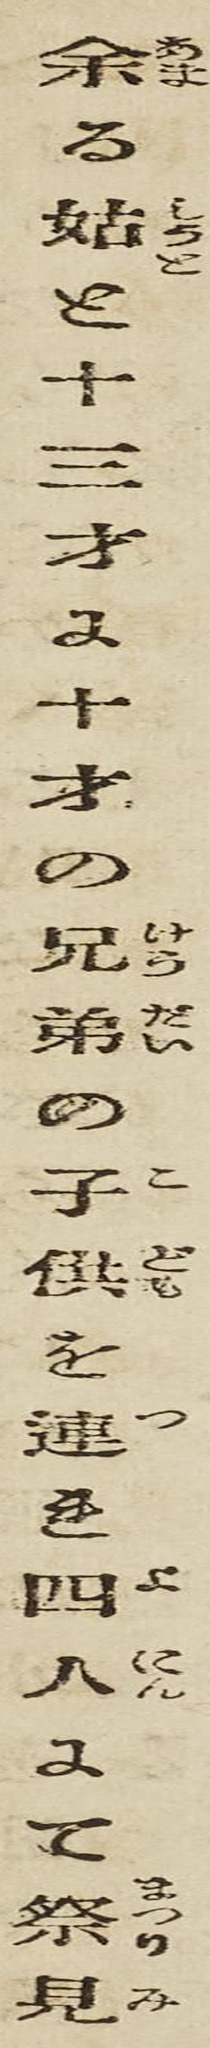余る姑と十三才に十才の兄弟の子供を連れ四人にて祭見
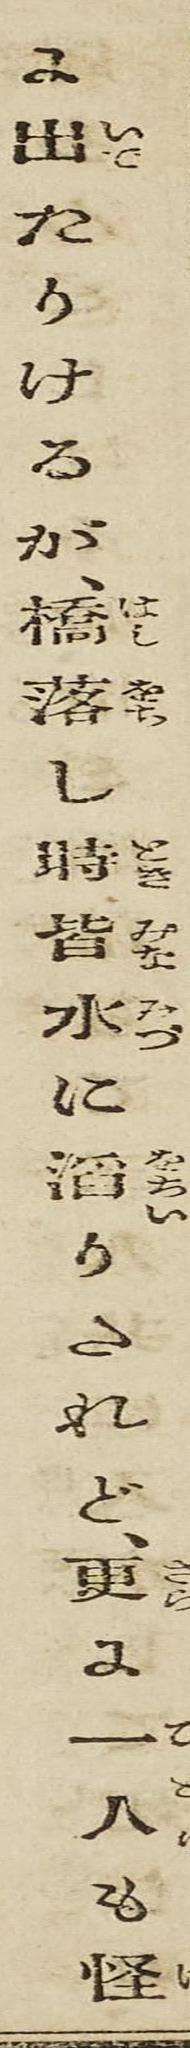に出たりけるが、橋落し時皆水に陥りたれど、更に一人も怪
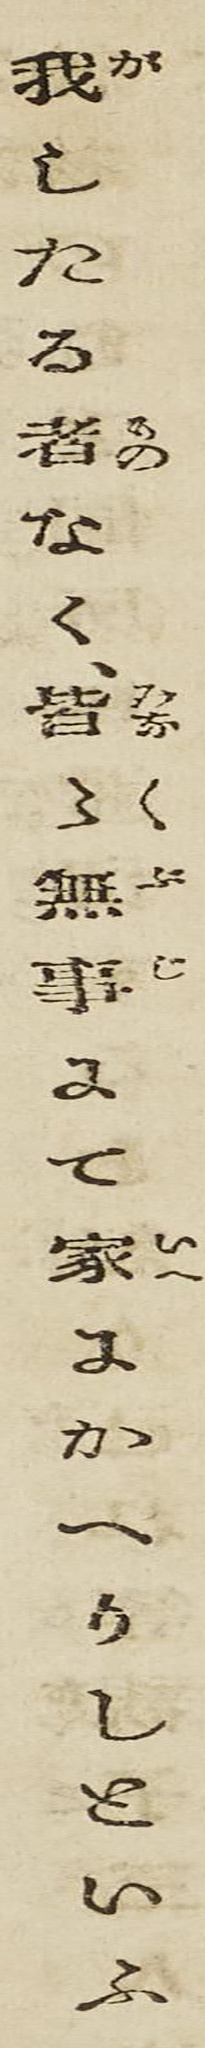我したる者なく、皆〻無事にて家にかへりしといふ
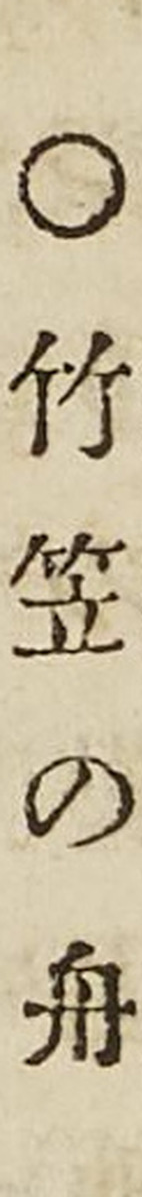○竹笠の舟
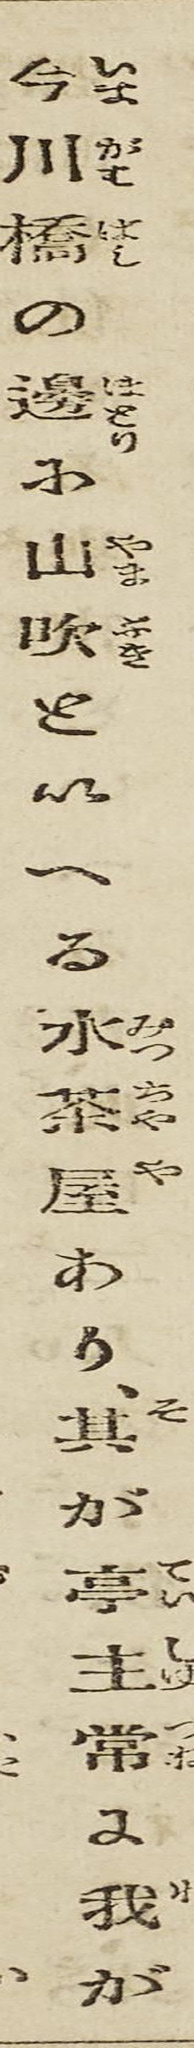今川橋の辺に山吹といへる水茶屋あり、其が亭主常に我が
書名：永代惨話　文化の夢　全
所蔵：東京大学地震研究所図書室 Earthquake Research Institute Library, The University of Tokyo, JAPAN
